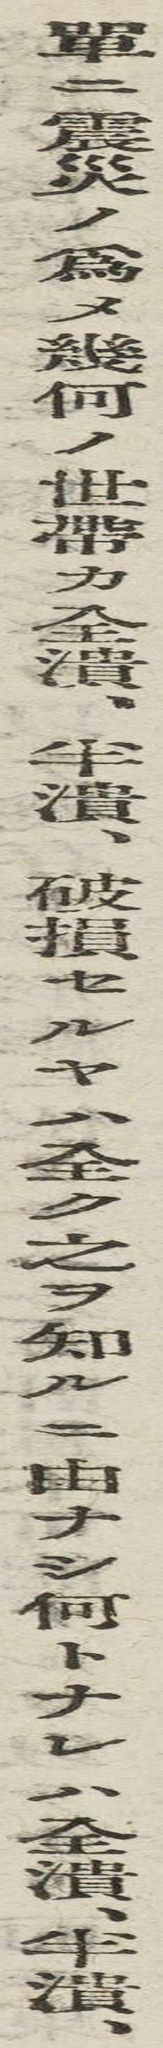単ニ震災ノ為メ幾何ノ世帯カ全潰、半潰、破損セルヤハ全ク之ヲ知ルニ由ナシ何トナレハ全潰、半潰、

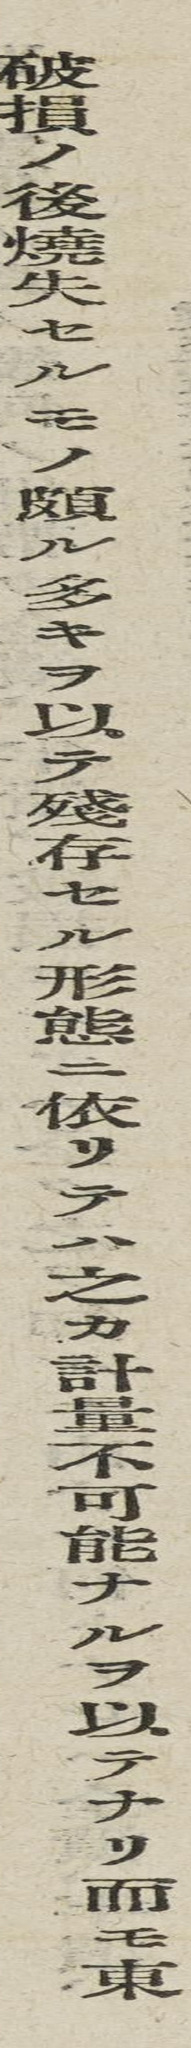破損ノ後焼失セルモノ頗ル多キヲ以テ残存セル形態ニ依リテハ之カ計量不可能ナルヲ以テナリ而モ東
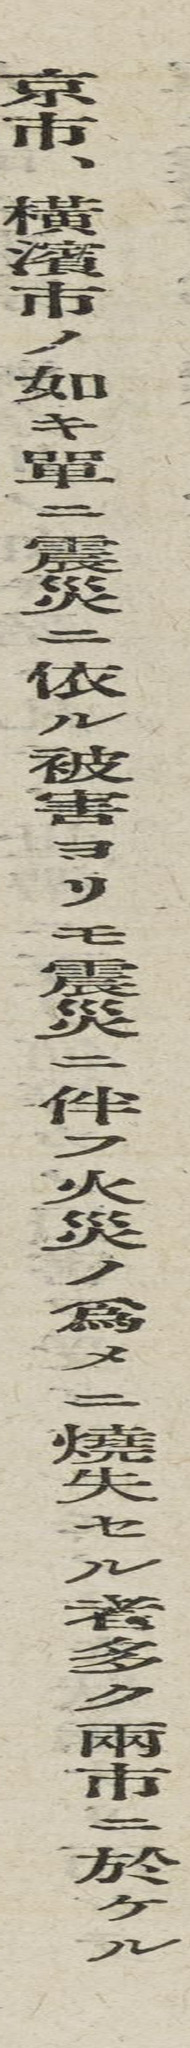京市、横浜市ノ如キ単ニ震災ニ依ル被害ヨリモ震災ニ伴フ火災ノ為メニ焼失セル者多ク両市ニ於ケル
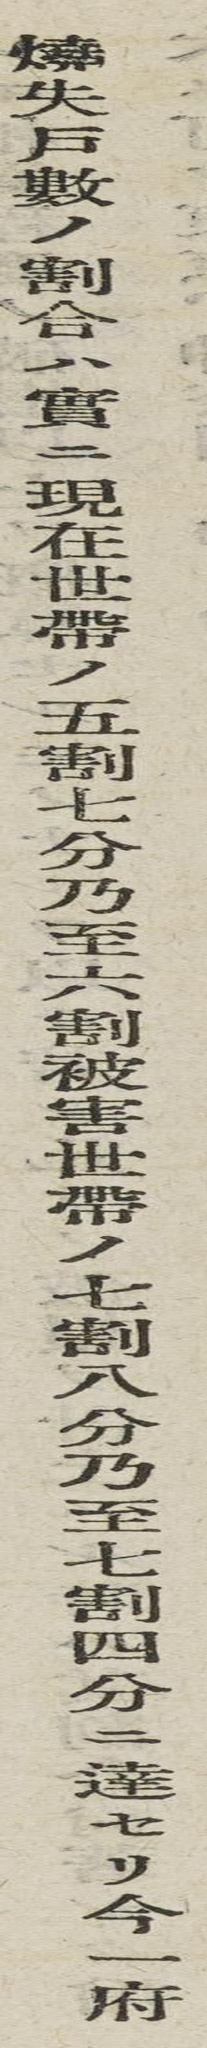焼失戸数ノ割合ハ実ニ現在世帯ノ五割七分乃至六割被害世帯ノ七割八分乃至七割四分ニ達セリ今一府
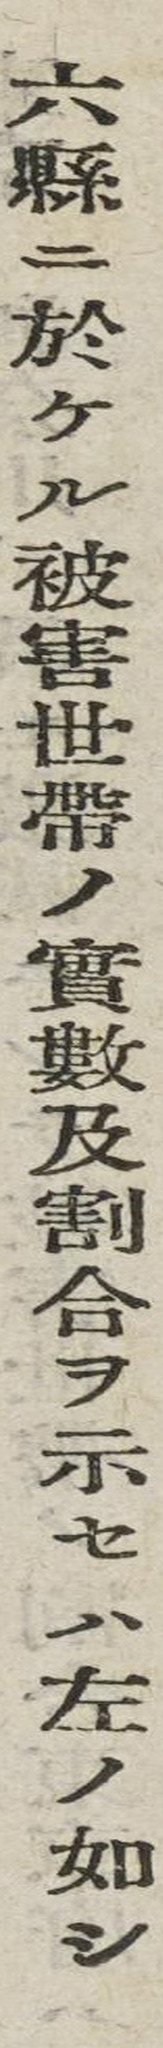六県ニ於ケル被害世帯ノ実数及割合ヲ示セハ左ノ如シ
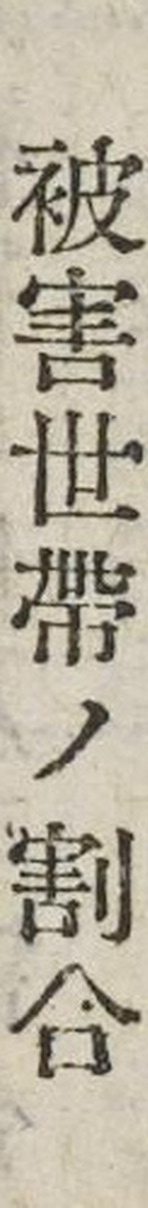被害世帯ノ割合
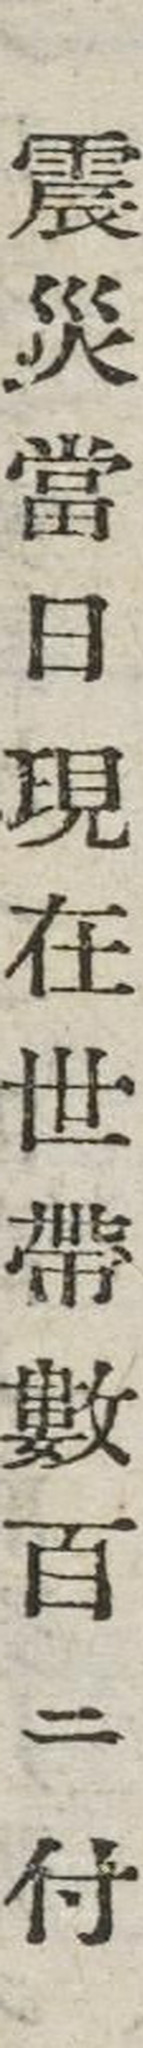震災当日現在世帯数百ニ付
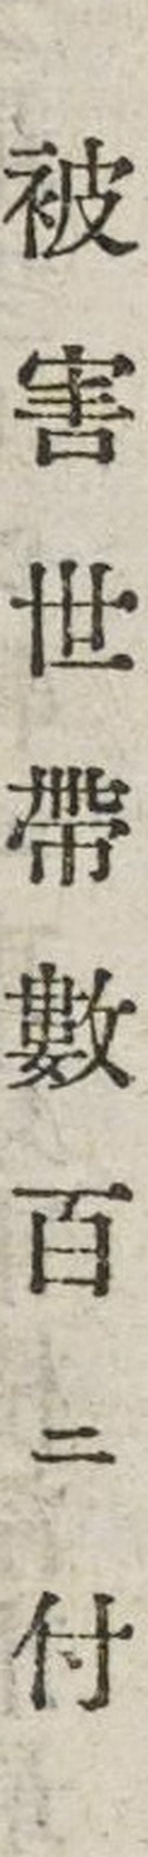被害世帯数百ニ付
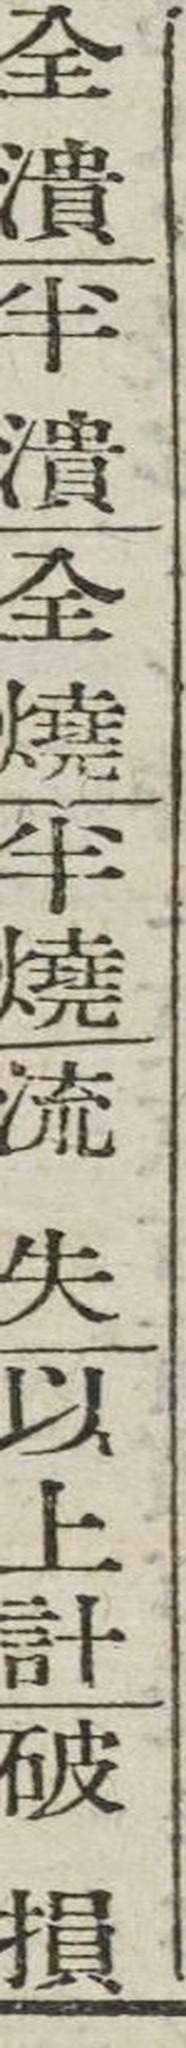全潰半潰全焼半焼流失以上計破損

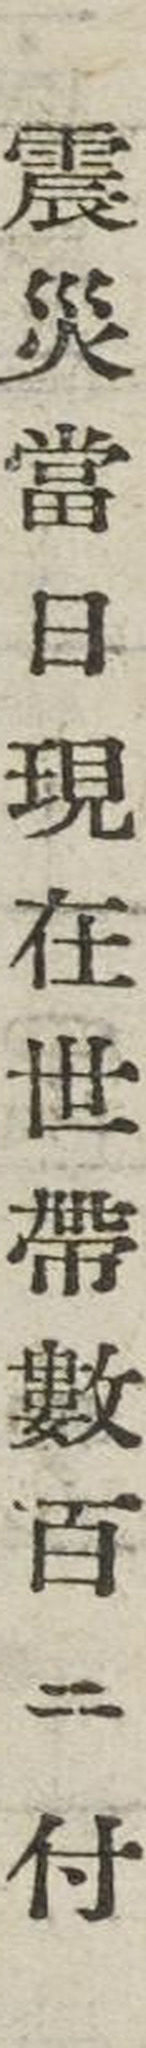震災当日現在世帯数百ニ付
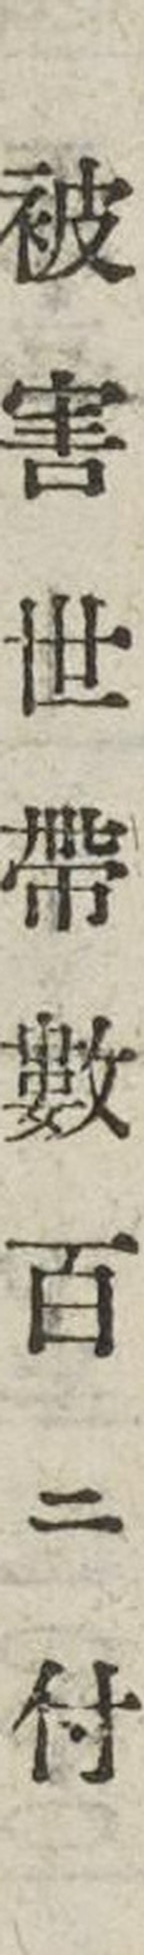被害世帯数百ニ付
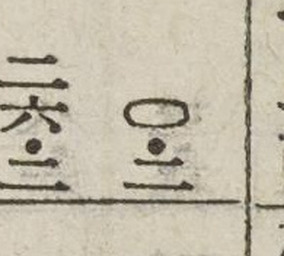九月一日
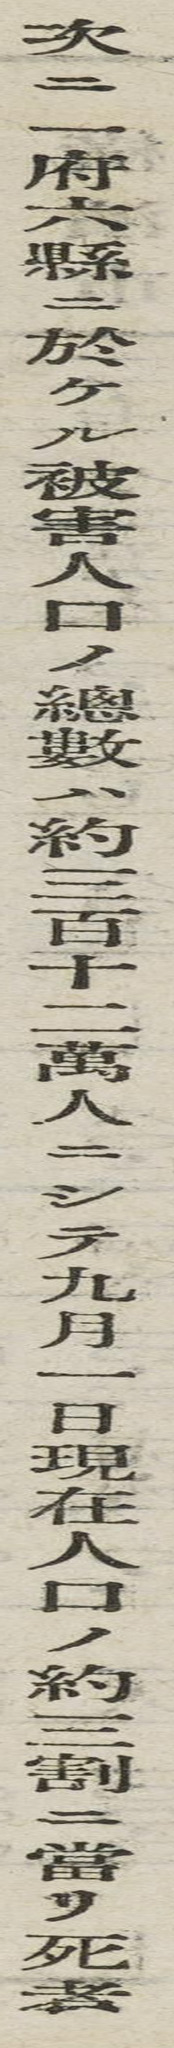次ニ一府六県ニ於ケル被害人口ノ総数ハ約三百十二万人ニシテ九月一日現在人口ノ約三割ニ当リ死者
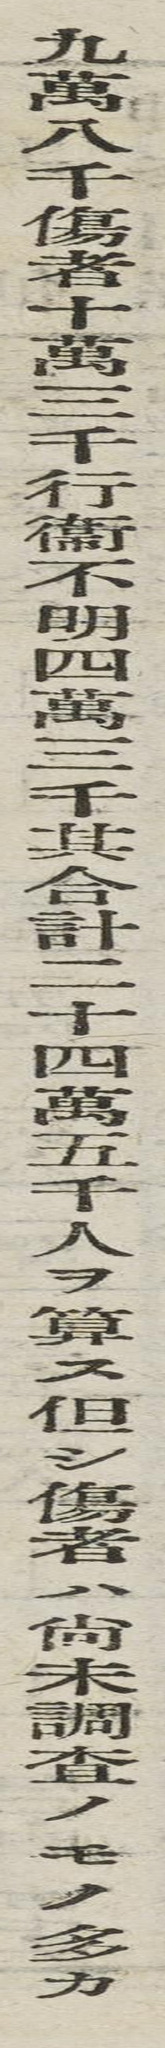九万八千傷者十万三千行方不明四万三千其合計二十四万五千人ヲ算ス但シ傷者ハ尚未調査ノモノ多カ
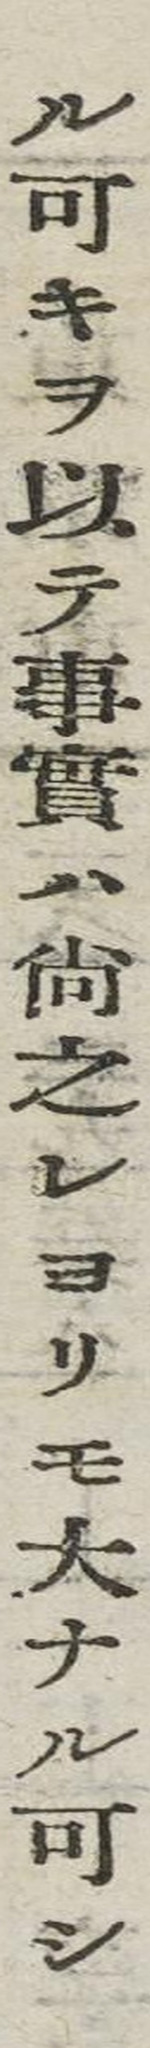ル可キヲ以テ事実ハ尚之レヨリモ大ナル可シ
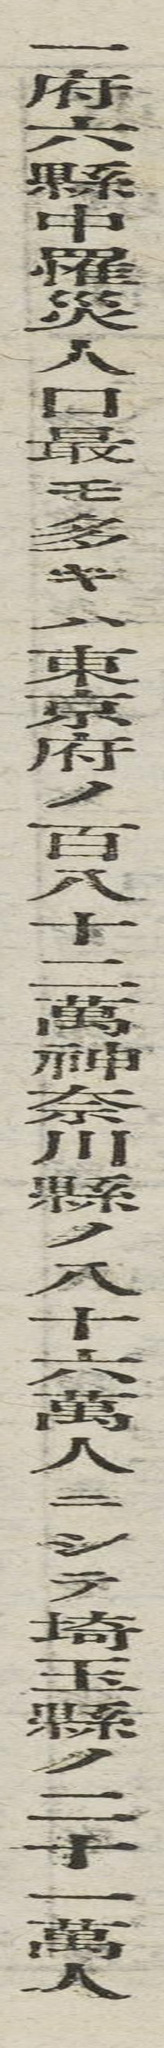一府六県中罹災人口最モ多キハ東京府ノ百八十二万神奈川県ノ八十六万人ニシテ埼玉県ノ二十一万人
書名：震災被害状況並救護施設概要
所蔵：東京大学地震研究所図書室 Earthquake Research Institute Library, The University of Tokyo, JAPAN
